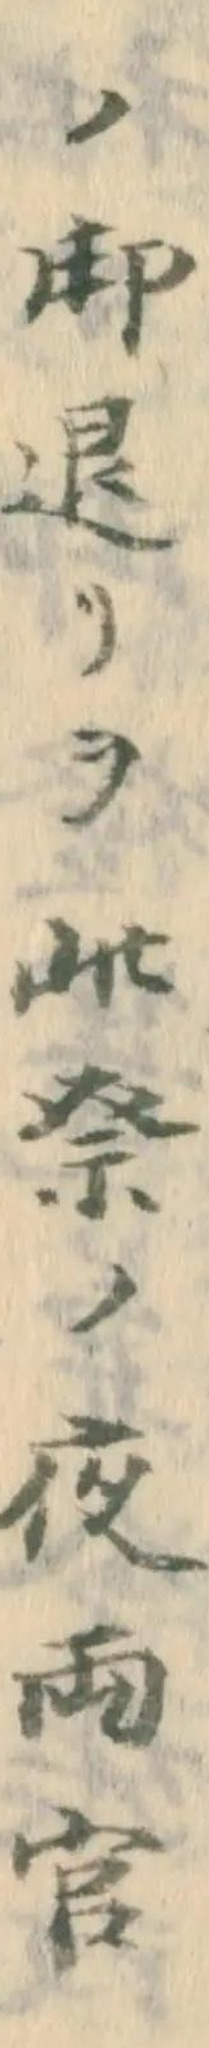ノ御退リヲ此祭ノ夜両官
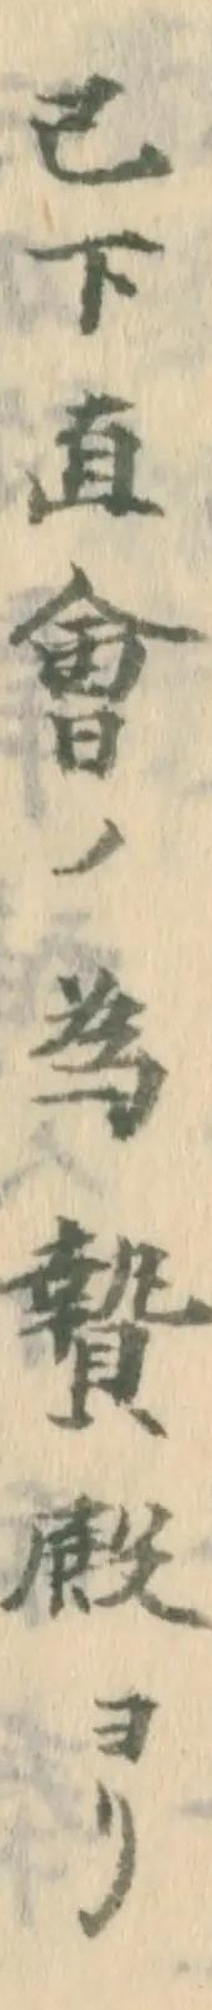已下直会ノ為贄殿ヨリ
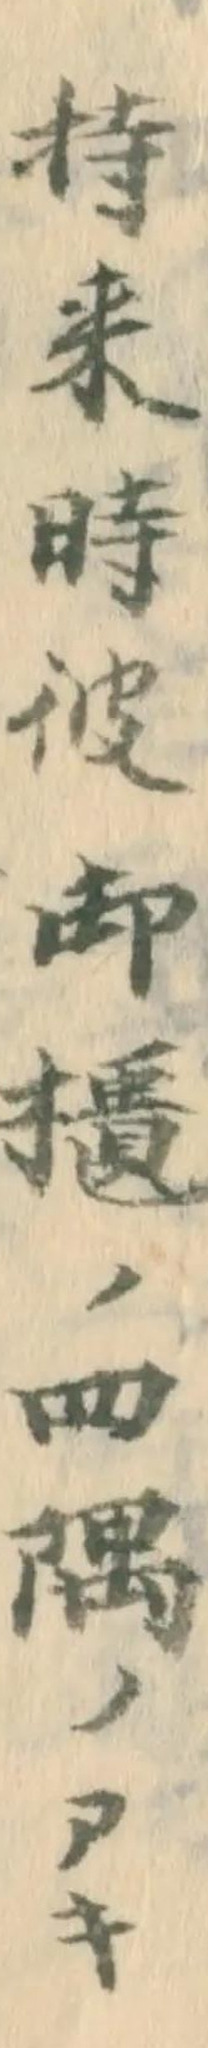持来時彼御櫃ノ四隅ノアキ
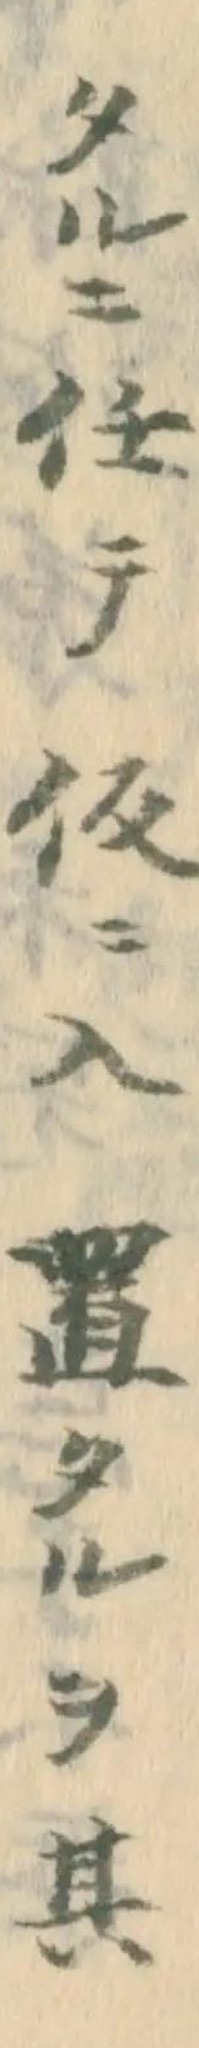タルニ任テ仮ニ入置タルヲ其
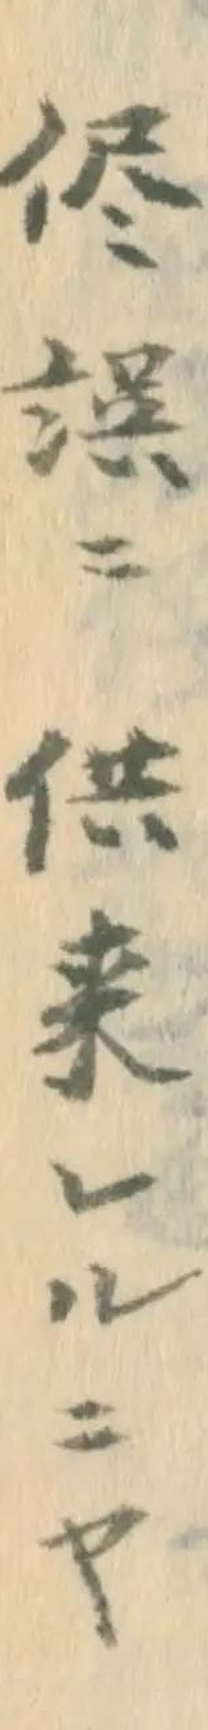儘誤ニ供来レルニヤ

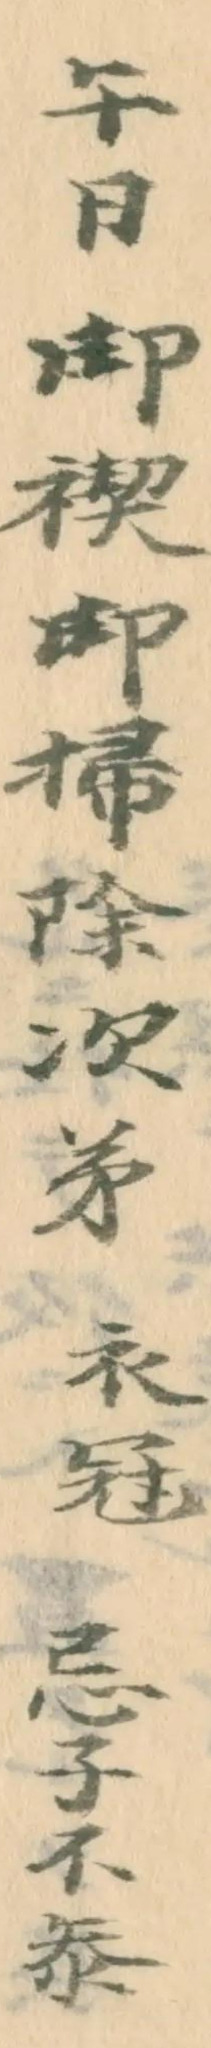午日御禊御掃除次第衣冠忌子不参
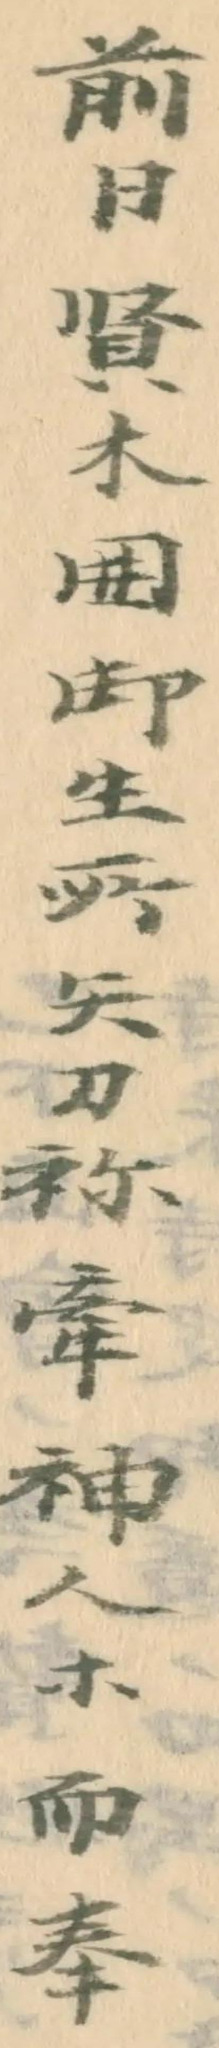前日賢木囲御生所矢刀禰牽神人等而奉
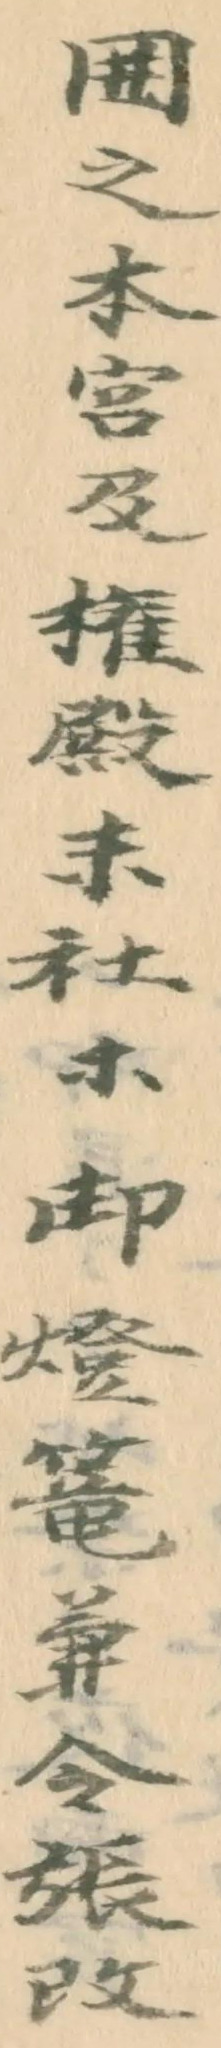囲之本宮及権殿末社等御燈籠兼令張改
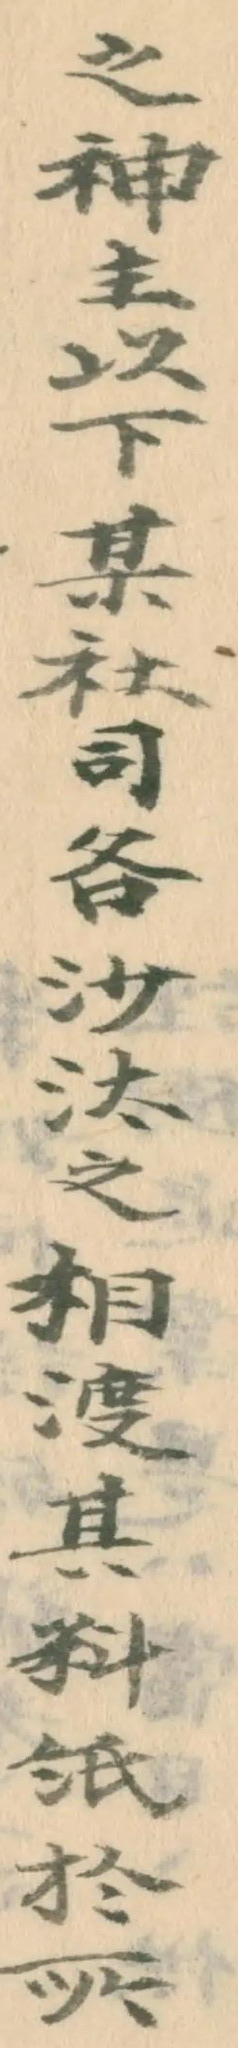之神主以下某社司各沙汰之相渡其料紙於所
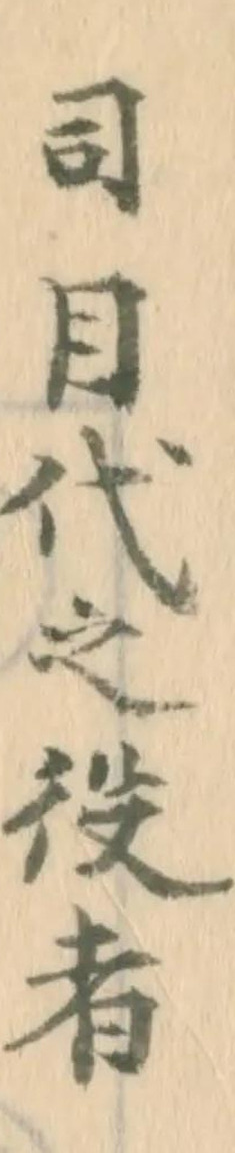司目代之役者
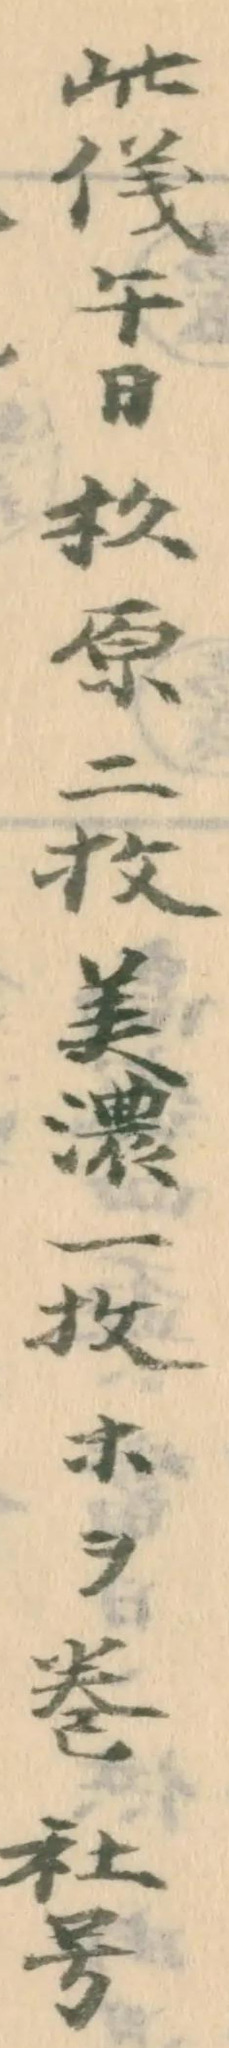此儀午日杉原二枚美濃一枚等ヲ巻社号
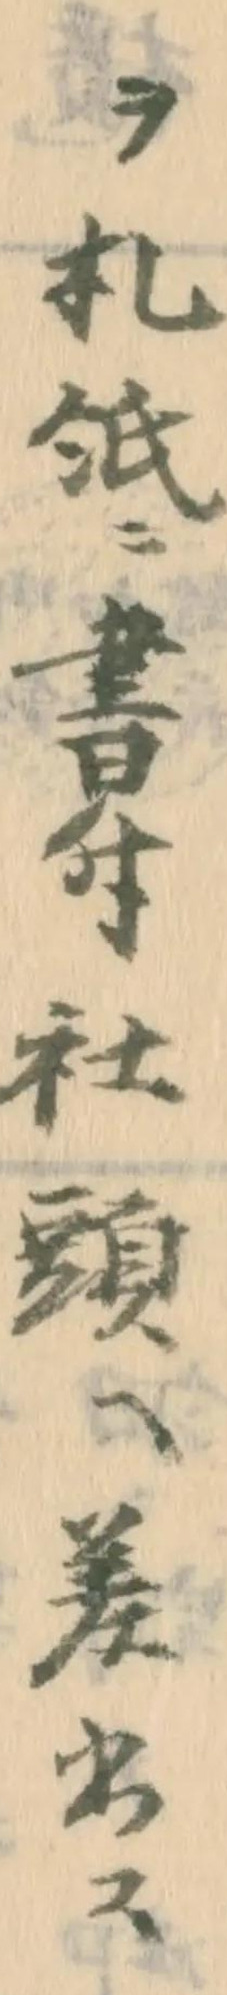ヲ札紙ニ書付社頭へ差出ス
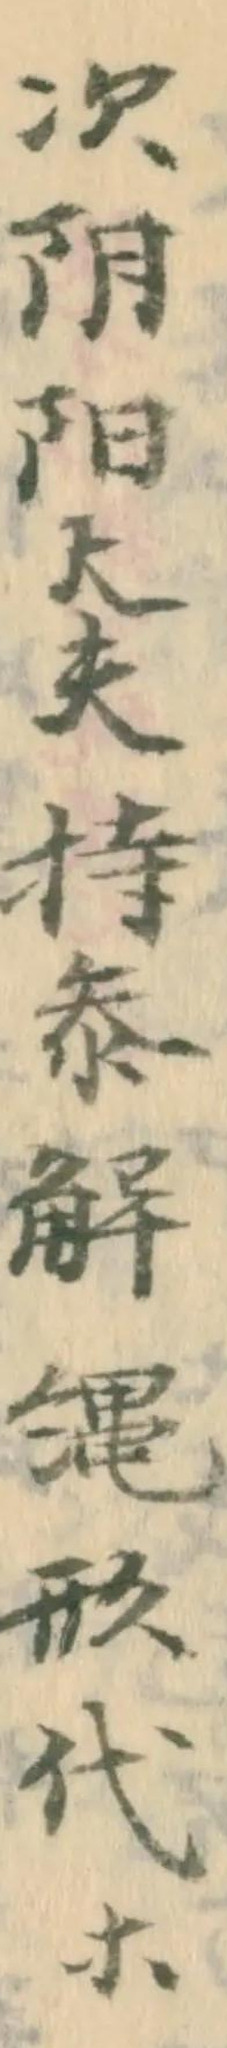次陰陽大夫持参解縄形代等
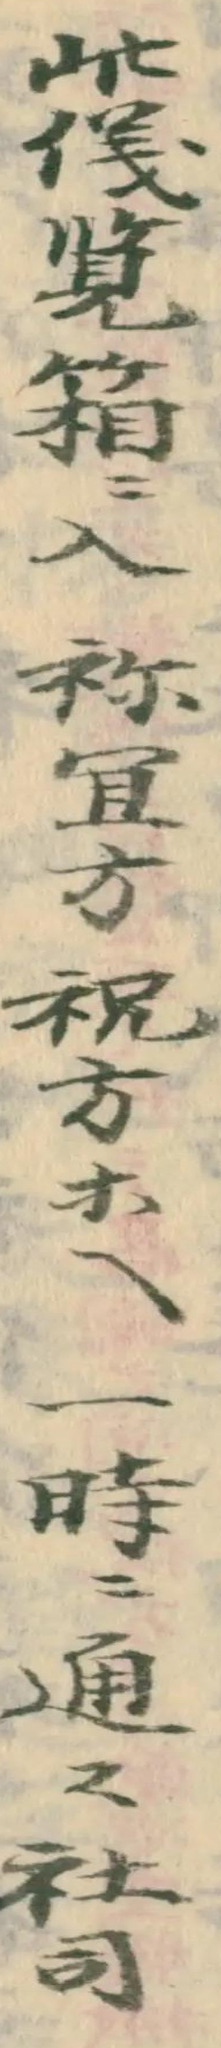此儀覧箱ニ入禰宜方祝方等ヘ一時ニ通ス社司
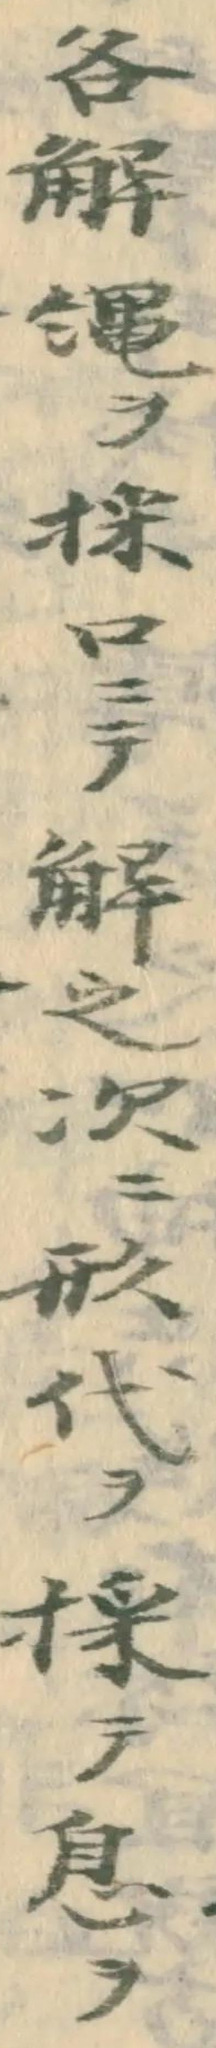各解縄ヲ採口ニテ解之次ニ形代ヲ採テ息ヲ
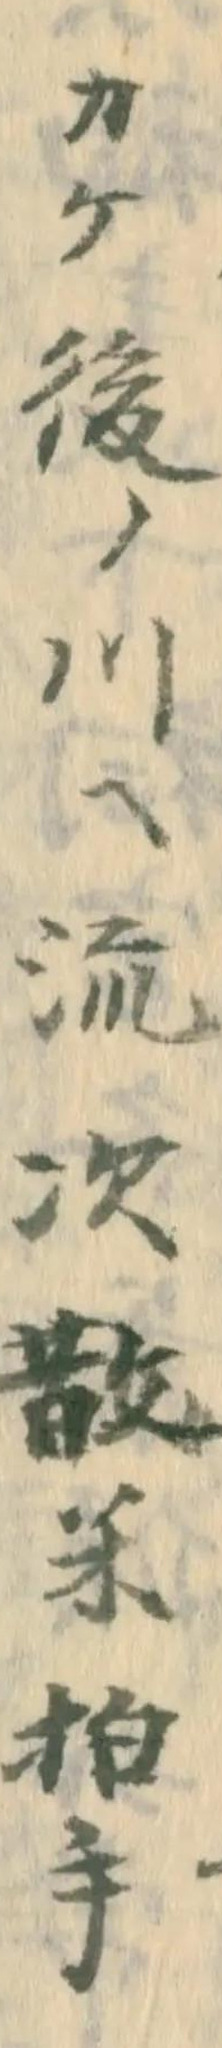カケ後ノ川へ流次散米拍手
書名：賀茂社記録. 第5冊
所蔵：国立国会図書館 National Diet Library, JAPAN
